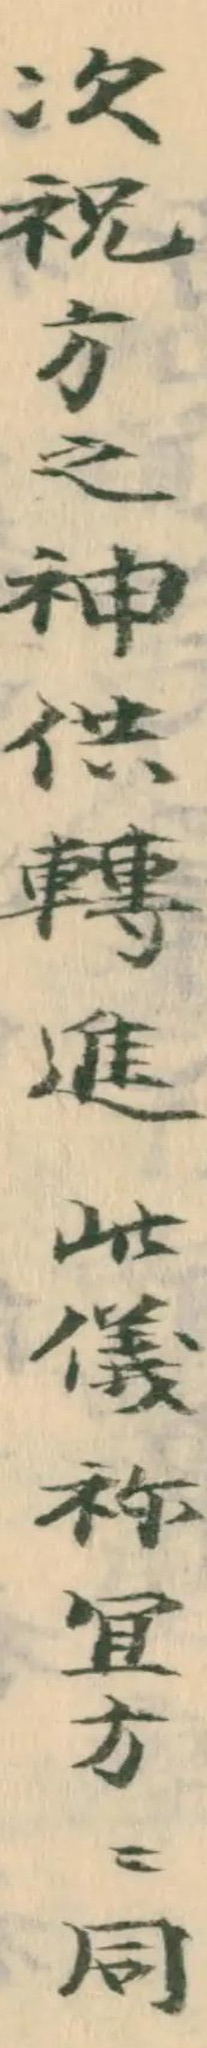次祝方之神供転進此儀禰宜方ニ同
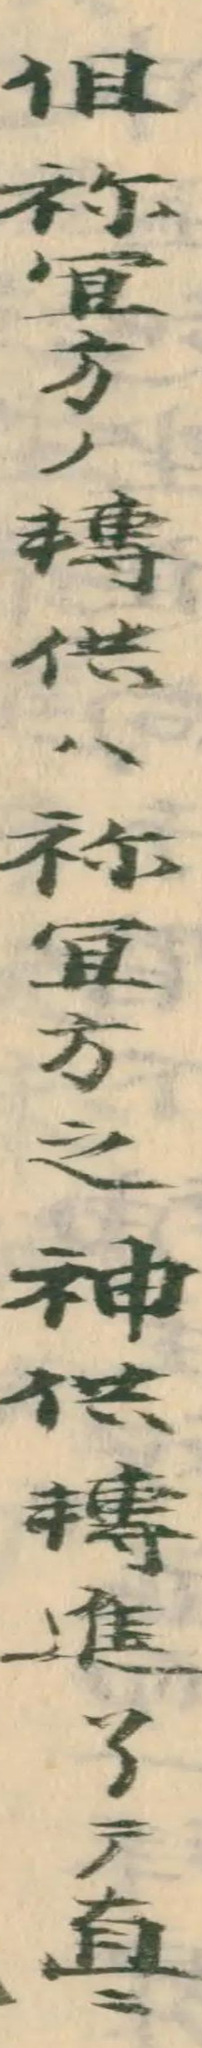但禰宜方ノ転供ハ禰宜方之神供転進了テ直ニ
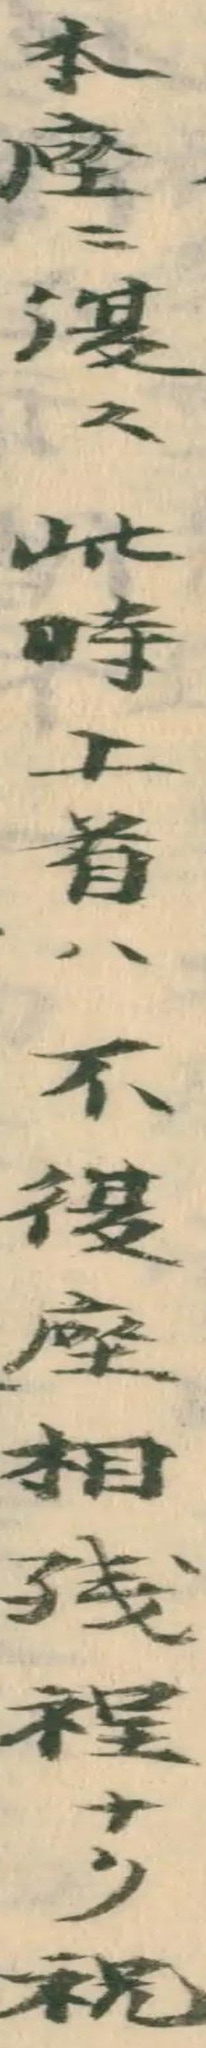本座ニ復ス此時上首ハ不復座相残程ナリ祝
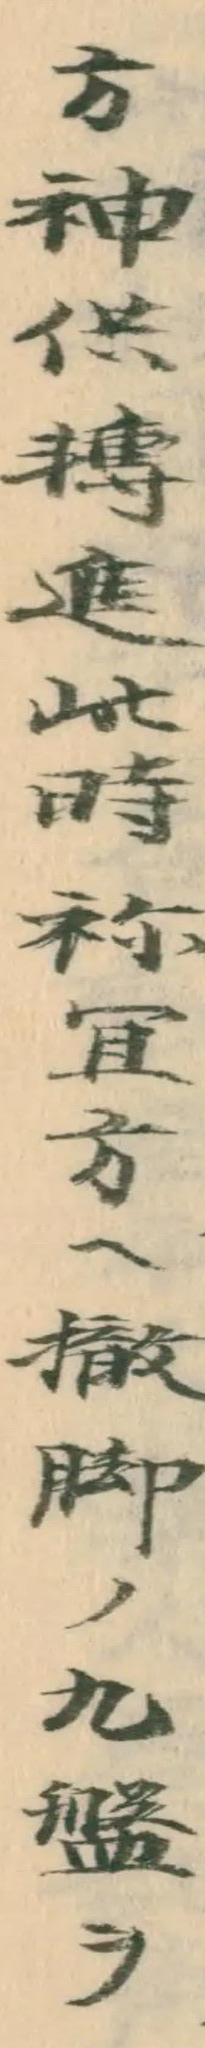方神供転進此時禰宜方ヘ撤脚ノ丸盤ヲ
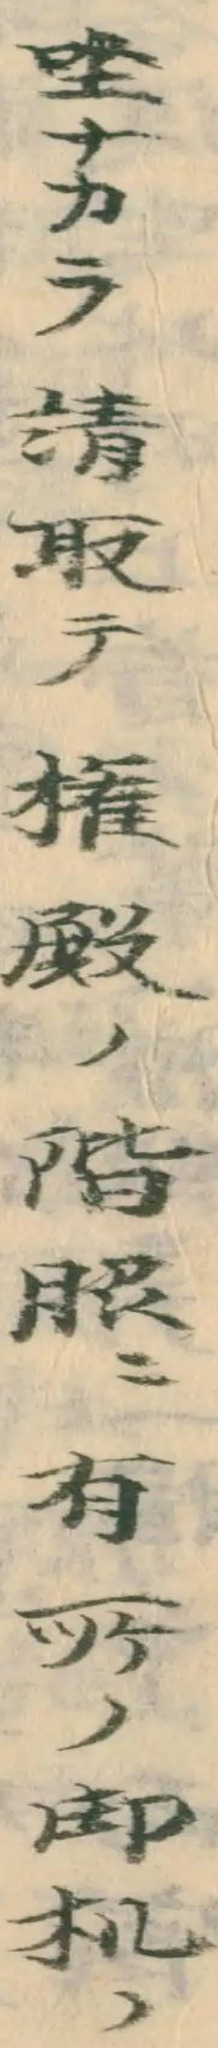坐ナカラ請取テ権殿ノ階脇ニ有所ノ御机ノ
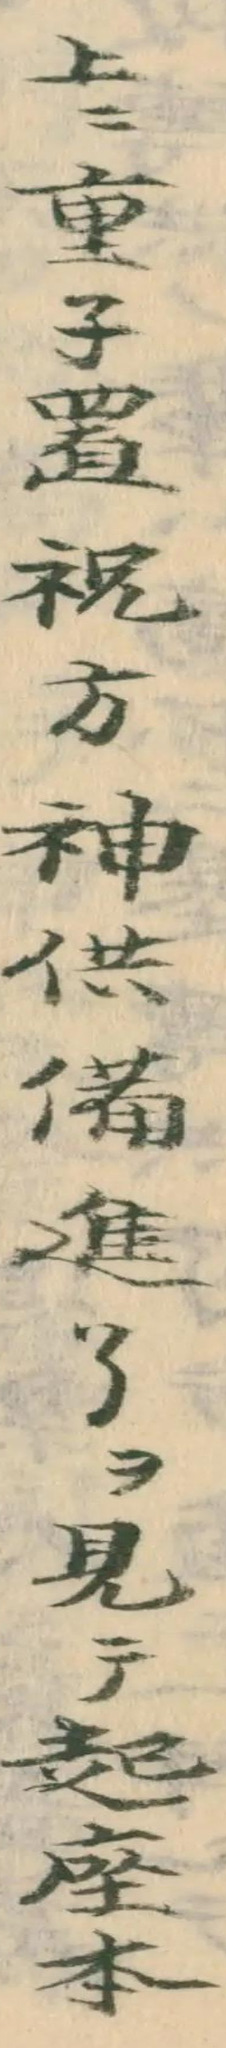上ニ重ネ置祝方神供備進了ヲ見テ起座本
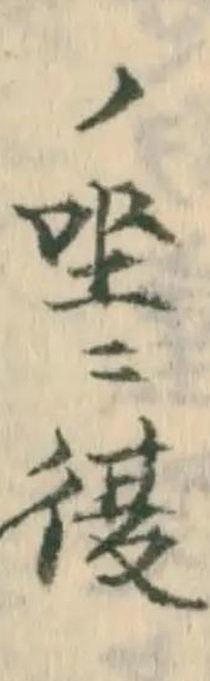ノ坐ニ復
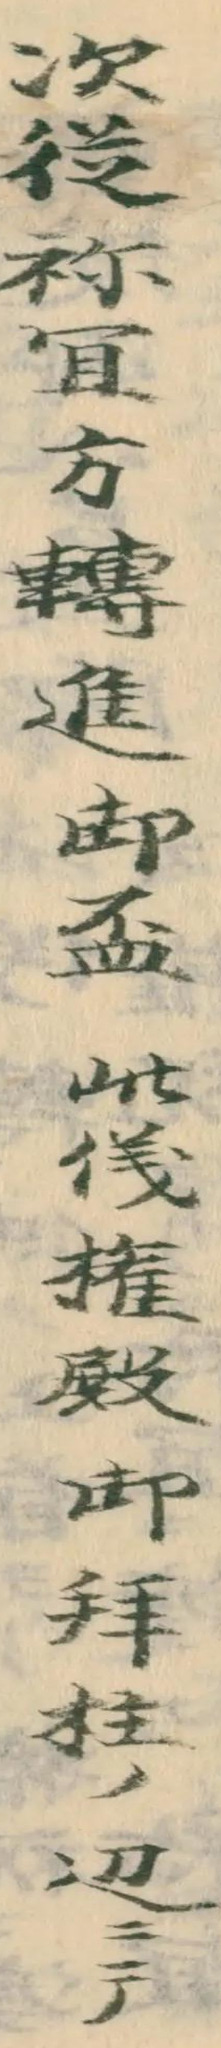次従禰宜方転進御盃此儀権殿御拝柱ノ辺ニテ
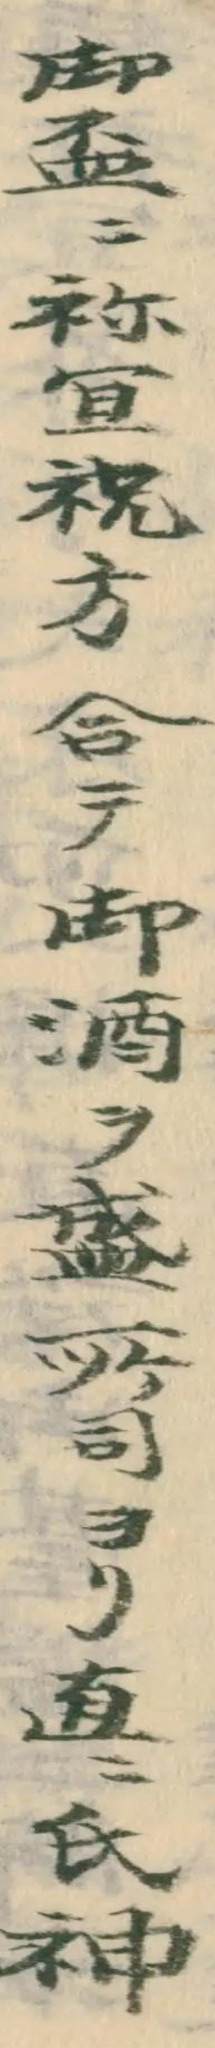御盃ニ禰宜祝方合テ御酒ヲ盛所司ヨリ直ニ氏神
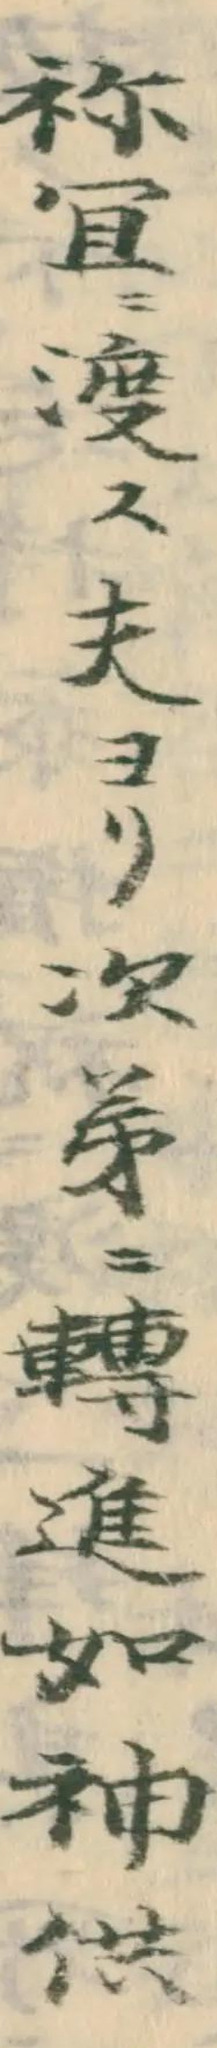禰宜ニ渡ス夫ヨリ次第ニ転進如神供
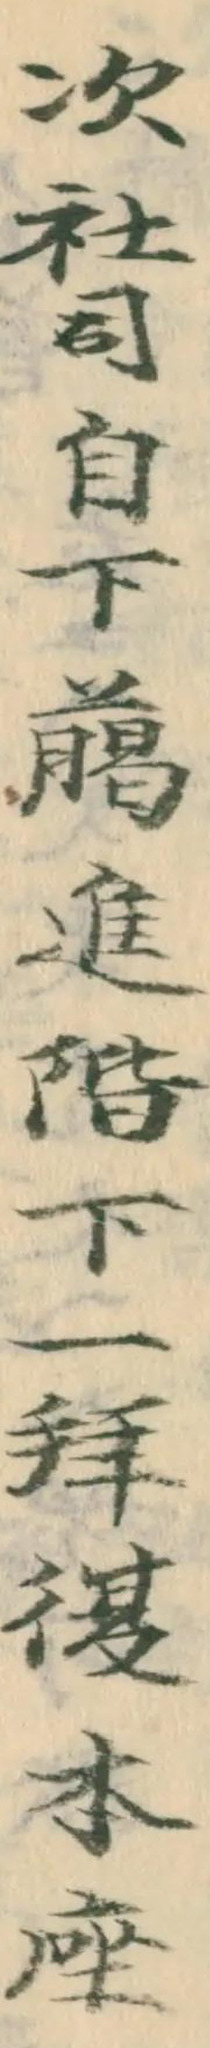次社司自下臈進階下一拝復本座
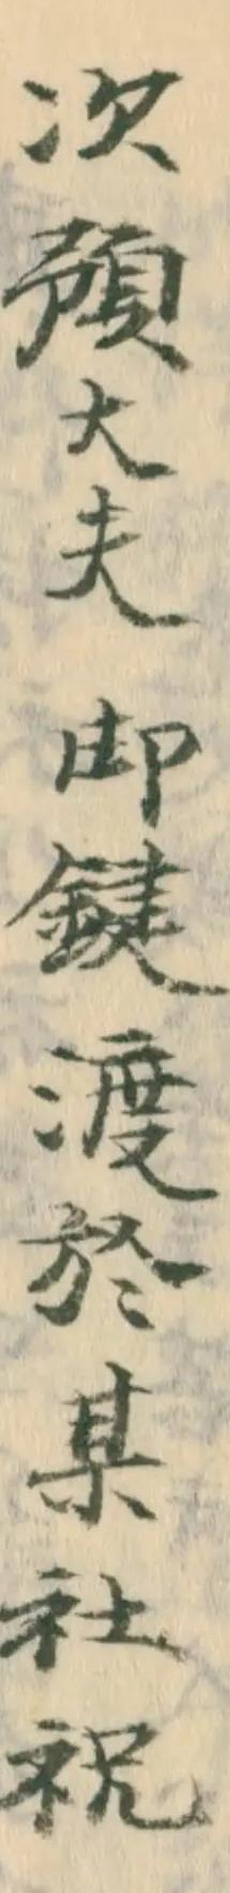次預大夫御鍵渡於某社祝
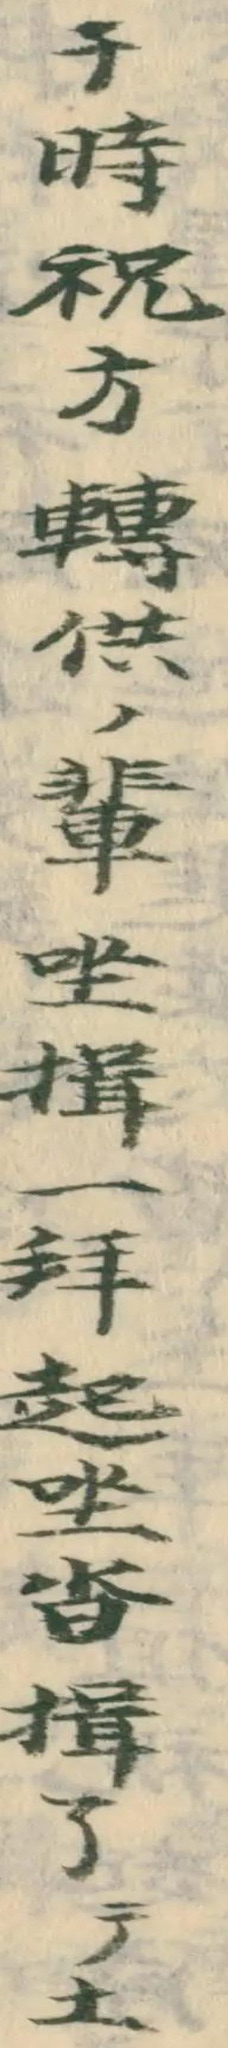于時祝方転供ノ輩坐揖一拝起坐沓揖了テ土
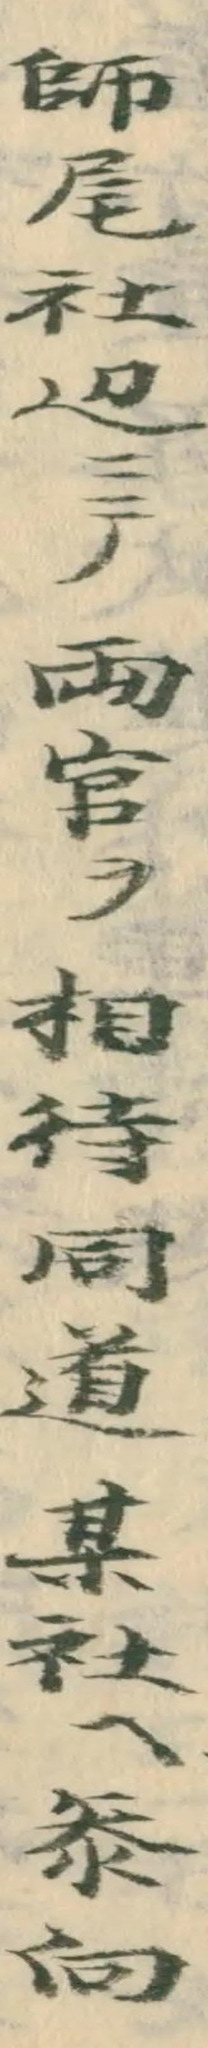師尾社辺ニテ両官ヲ相待同道某社へ参向
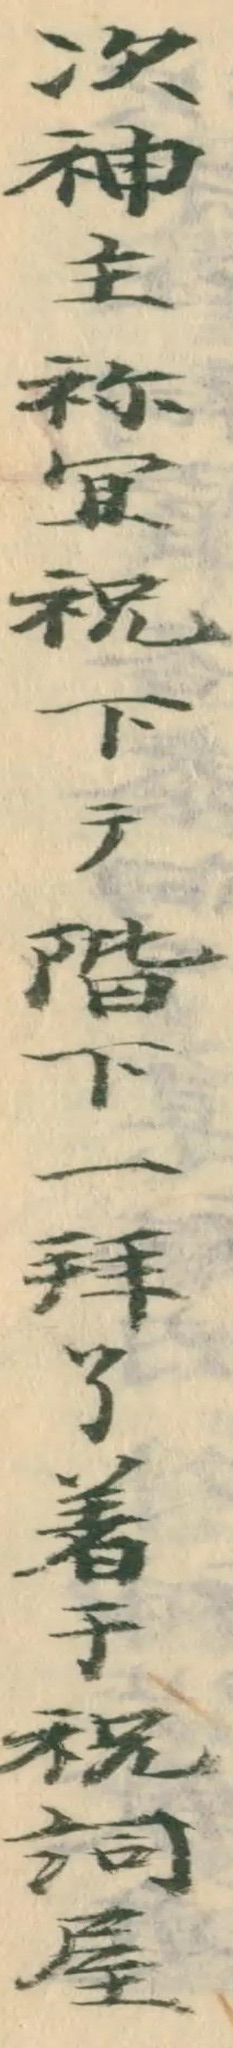次神主禰宜祝下テ階下一拝了着于祝詞屋

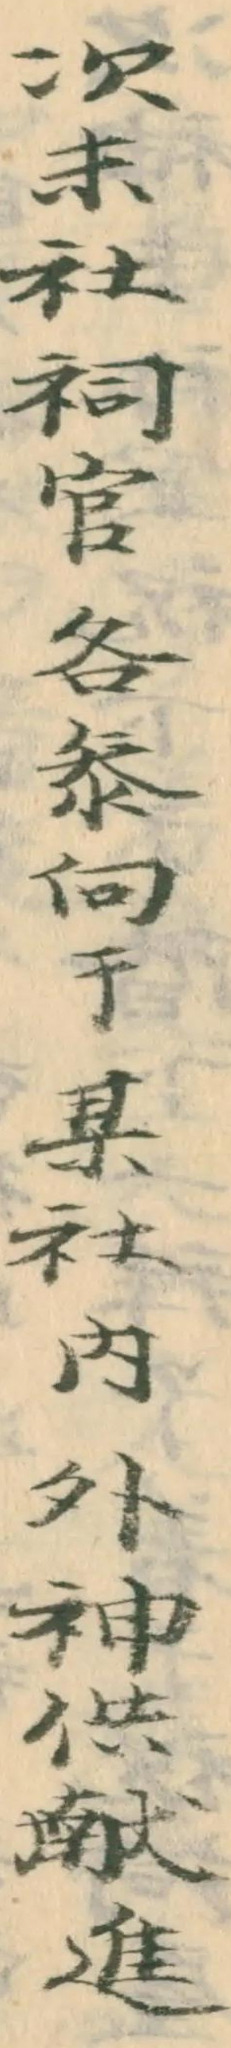次末社祠官各参向于某社内外神供献進
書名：賀茂社記録. 第5冊
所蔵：国立国会図書館 National Diet Library, JAPAN
